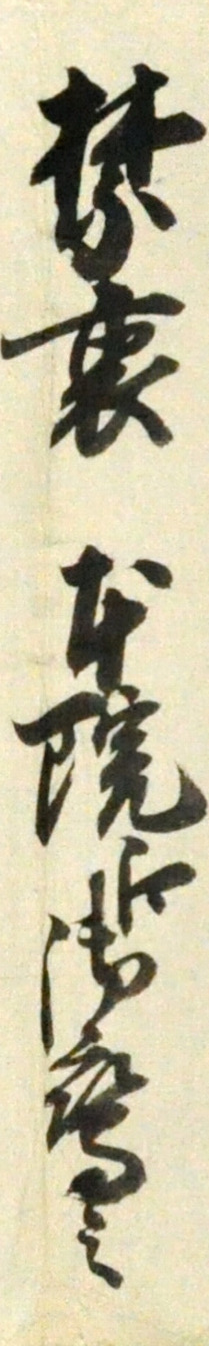禁裏本院江御鷹之
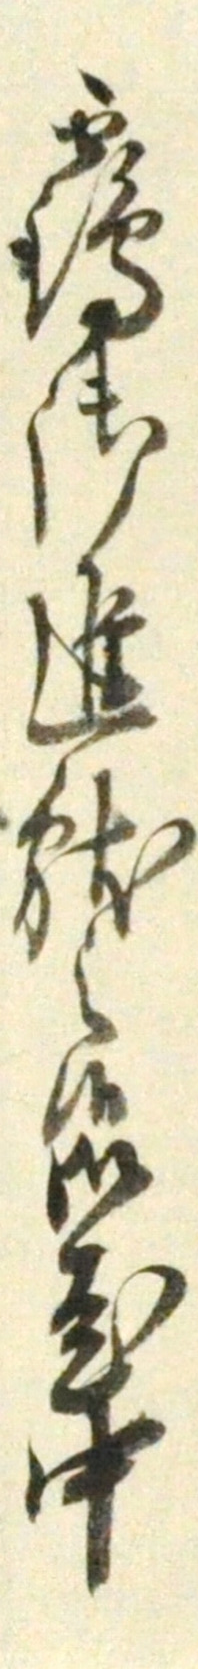鶴御進献之候御老中
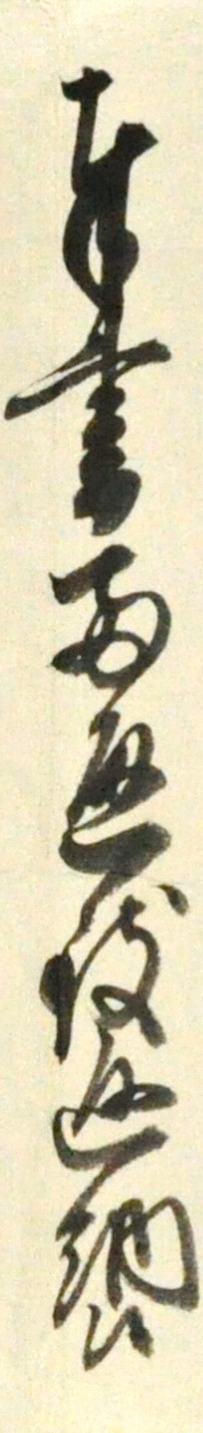奉書両通致返納候
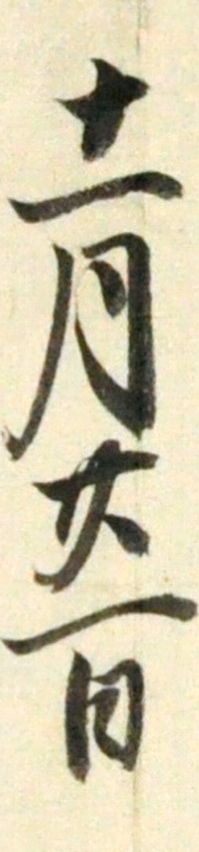十一月廿一日
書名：覚
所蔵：伊那市立高遠町図書館・合同会社AMANE
